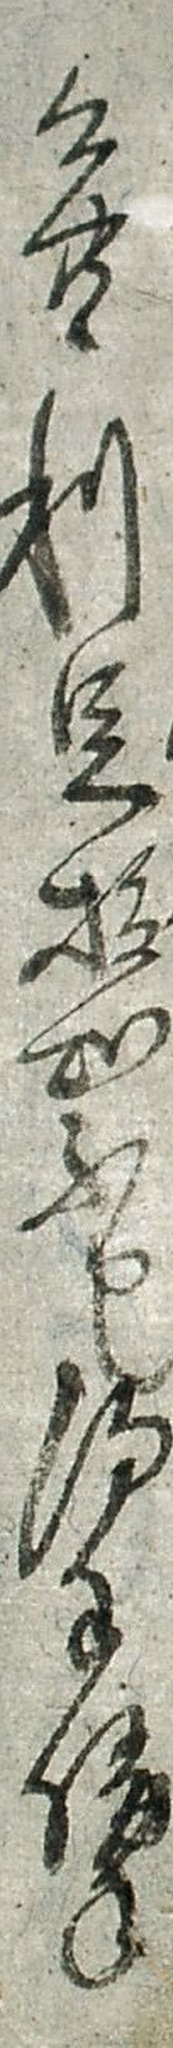候共利足指出不申候得手勝手
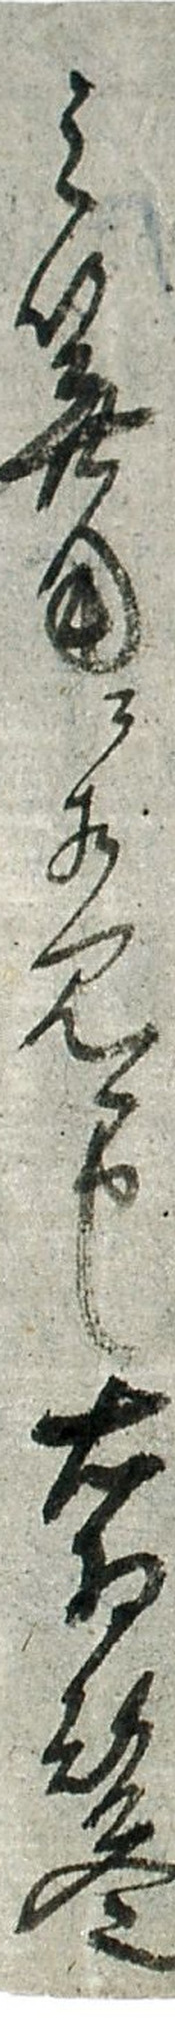之算用に相見へ申候右為替合之
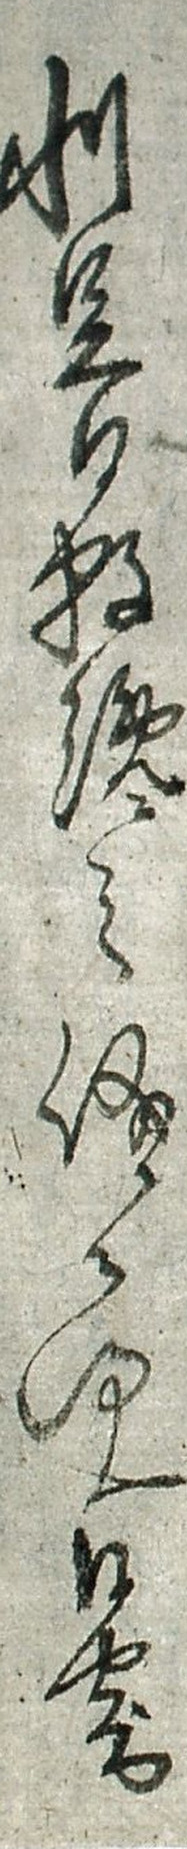利足日数纔之儀に候得は日歩
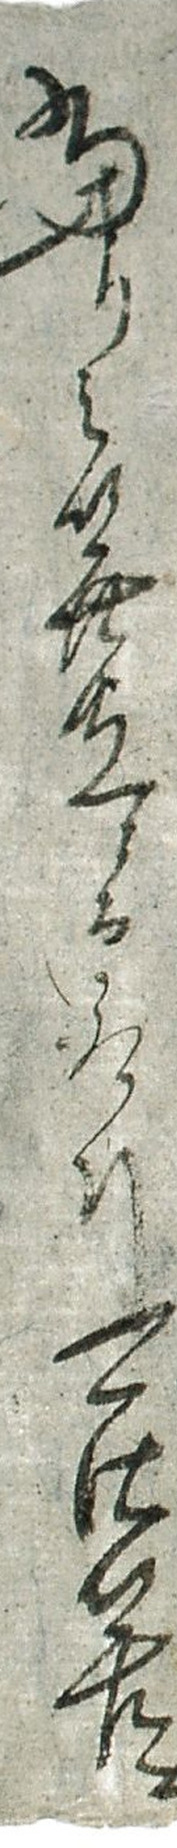当り之算立にて取引可仕筈に
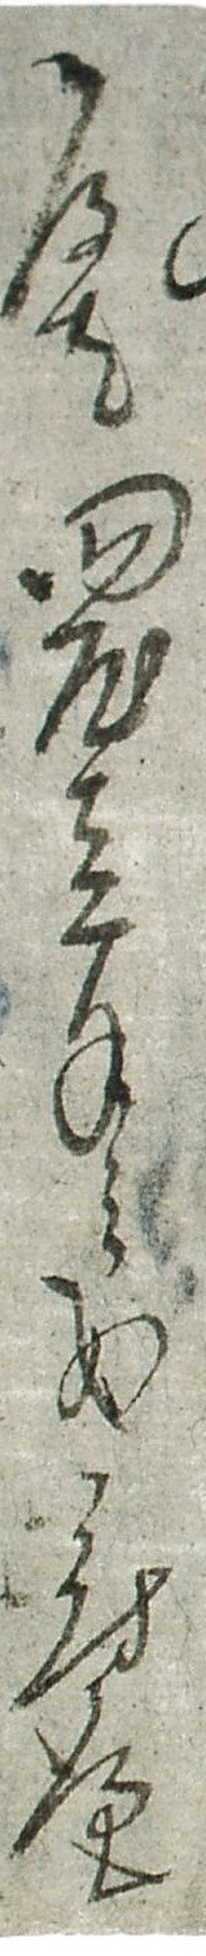候得は問屋壱手之義御座候得は
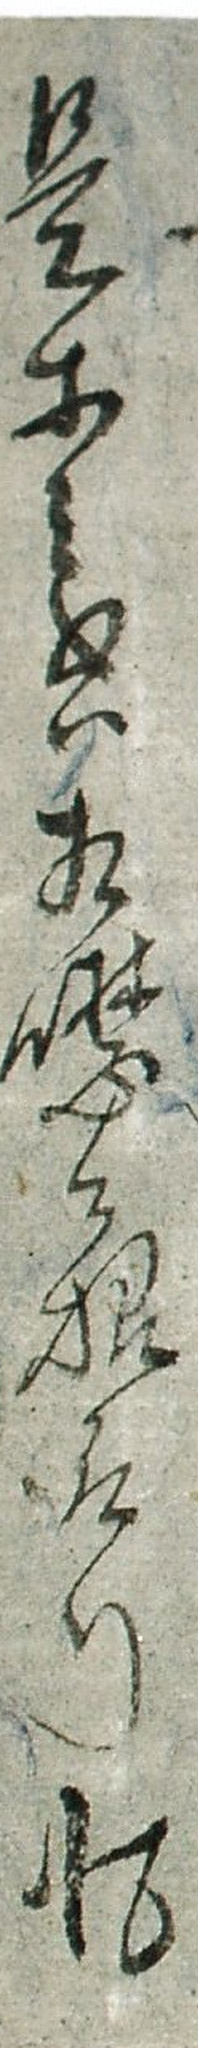是等之義は相噤候様取引仕
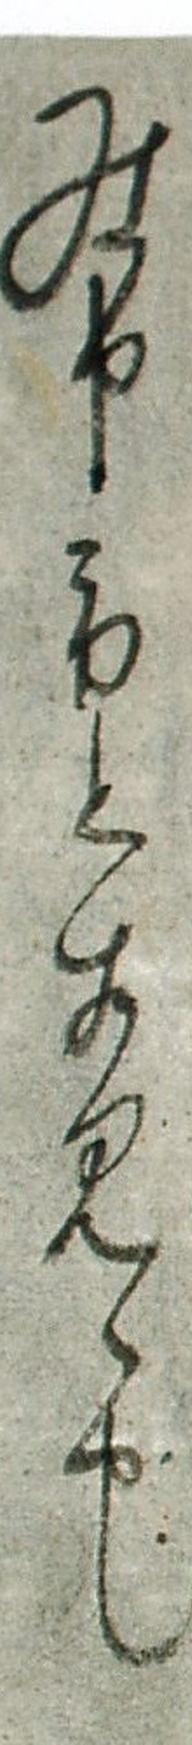居申方と相見へ申候
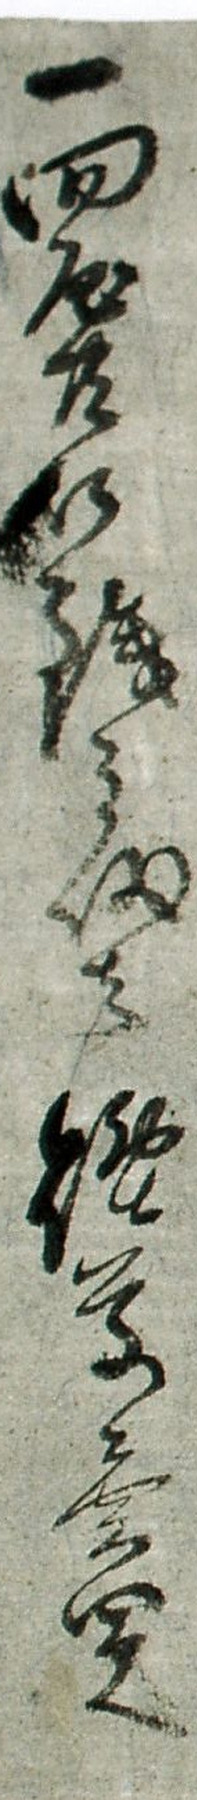一問屋共口錢之儀は煙草売買
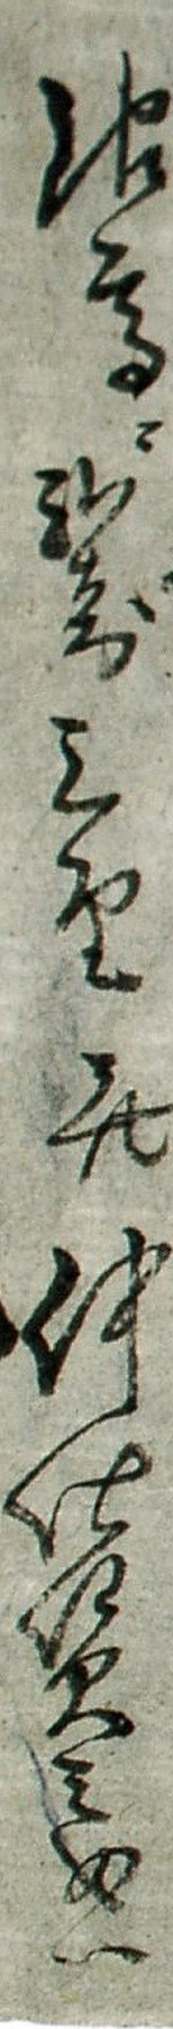銀高に弐歩三厘并仲仕賃之義は
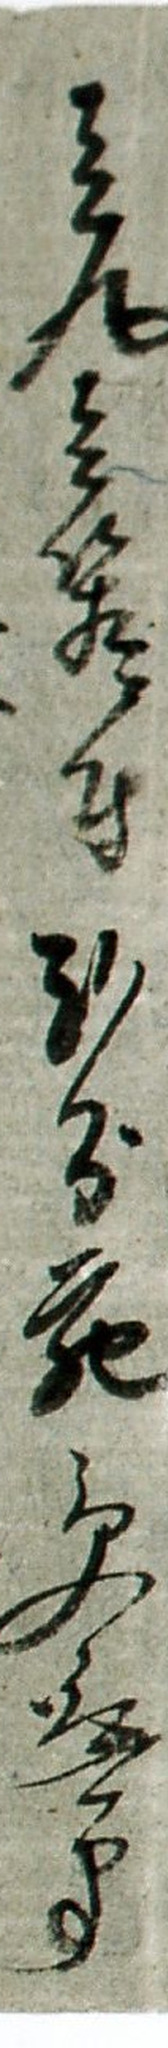壱丸壱箱に付弐分宛受取可申事
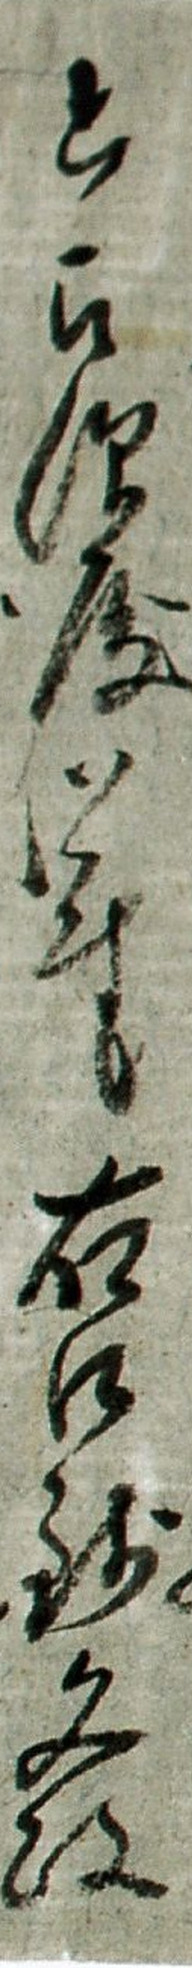と被仰渡御座候右口銭文政
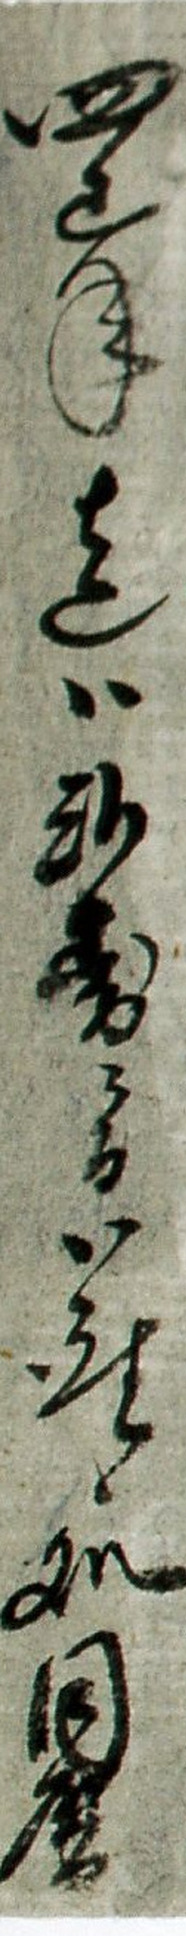四巳年迄は弐歩にて御座候処同暦
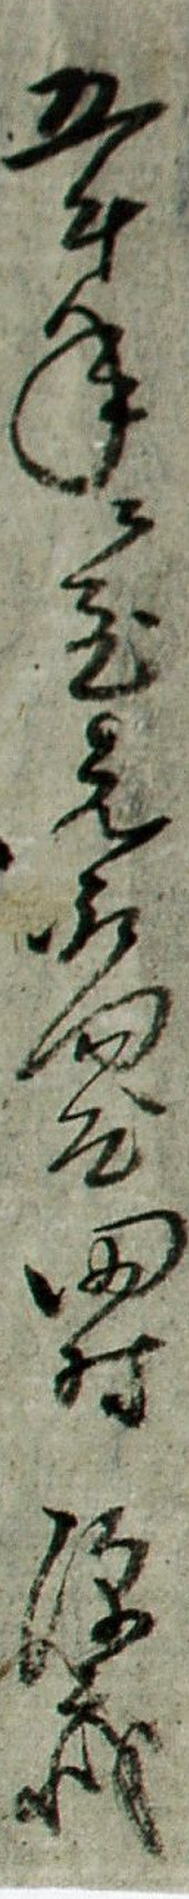五午年に至元取問屋田村源蔵
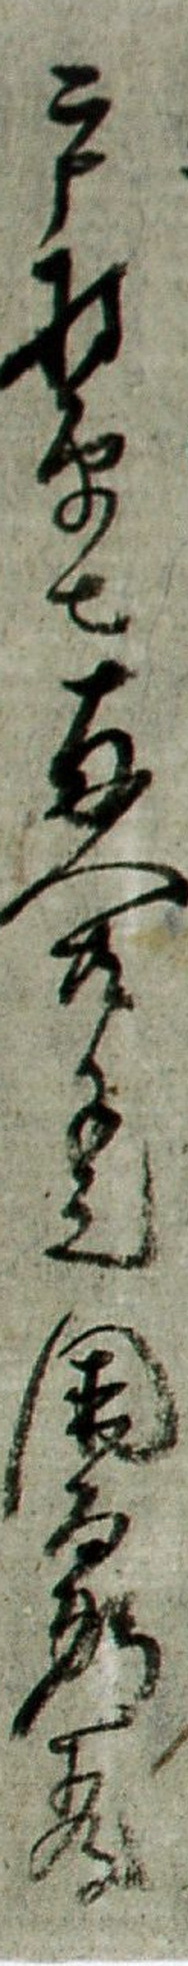戸村平七両人共手元困窮に相及

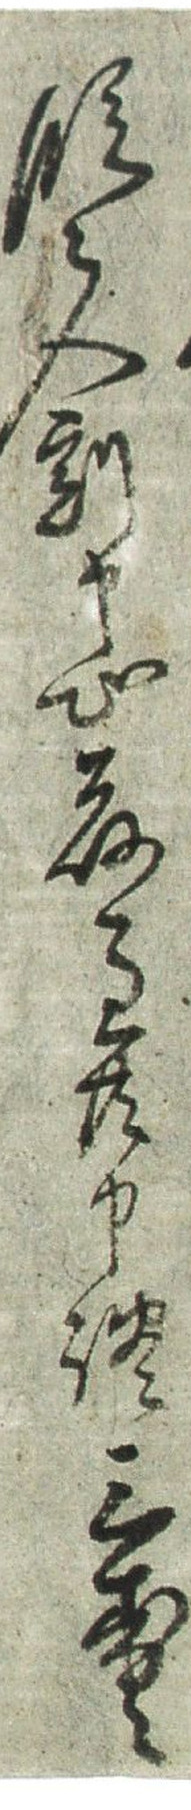段々入割申出荷主共申談三歩之
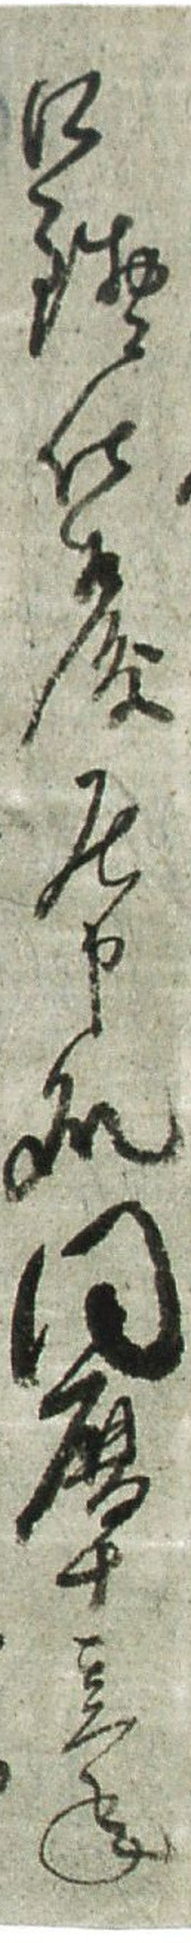口銭に仕相渡居申処同暦十亥年
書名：(美馬三好両郡百姓共煙草問屋壱手勘定ニ相成迷惑願右始末承申上書付之写）
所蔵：鳴門教育大学 Naruto University of Education
